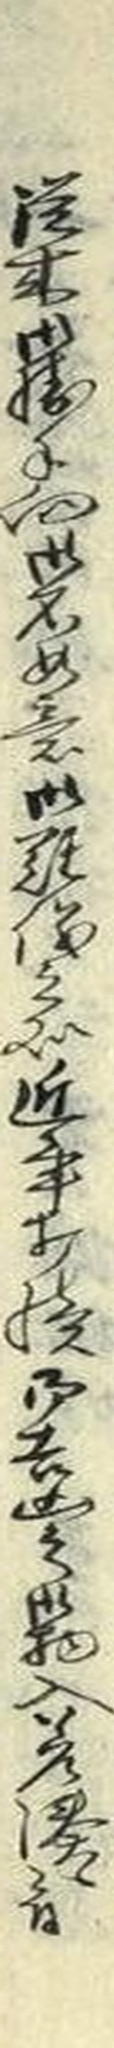従来御勝手向御不如意御難儀之処近年打続御吉凶之御物入差湊候ニ付
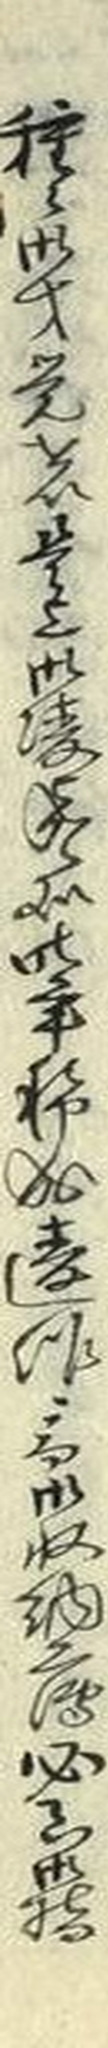種々御才覚を以是迄御凌被成候処昨年稀成違作ニ而御収納薄必至御指
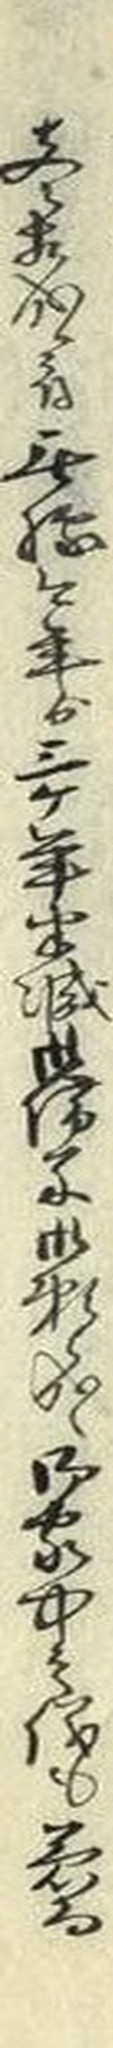支ニ相成候ニ付無拠今年ゟ三ケ年半減御借米御頼被成候御家中之儀も兼而
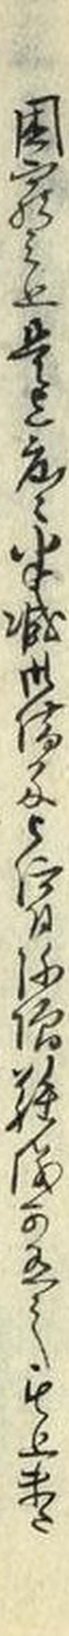困窮之上是迄度々半減御借米被仰付弥増難儀可有之其上未た
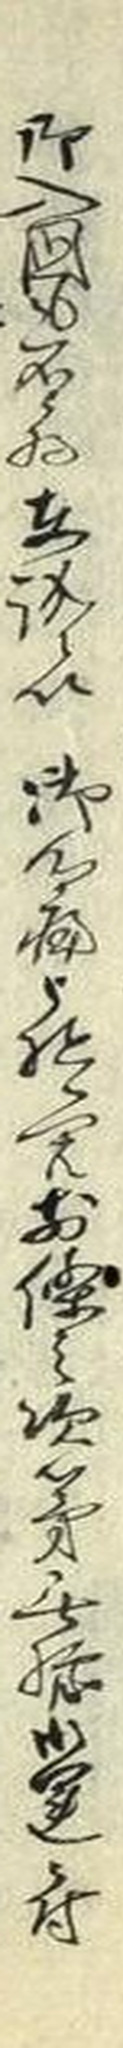御入国も不被為在誠ニ以御心痛被遊候へ共前條之次第無拠御運ニ付
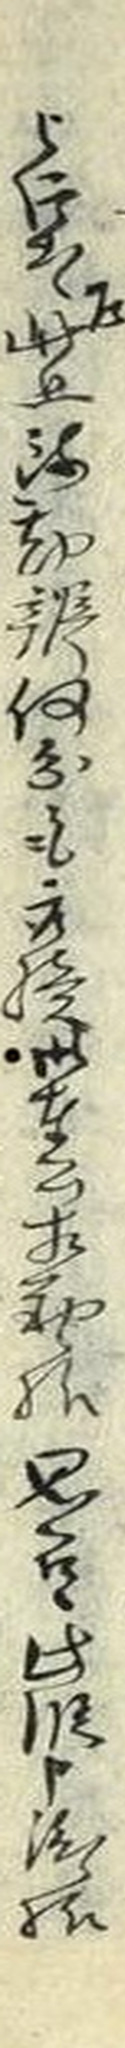被仰出候乍此上致勘弁何分ニも取続御奉公相勤候様思召候此段申渡候様
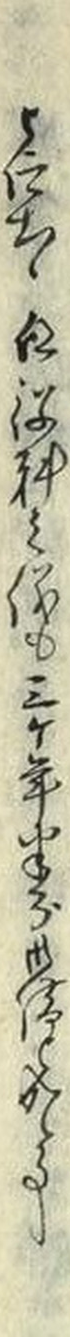被仰出候但役料之儀も三ケ年半分御借被成候事
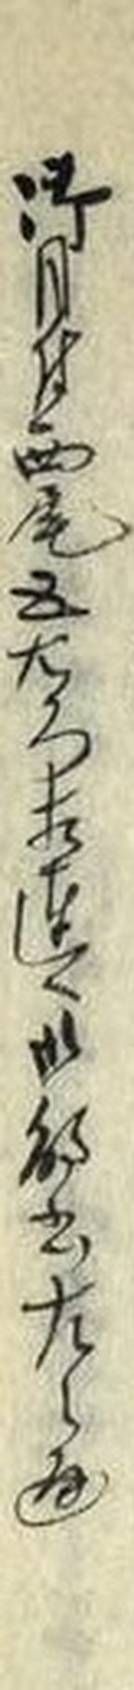御目付西尾五右衛門相達候御触書左之通
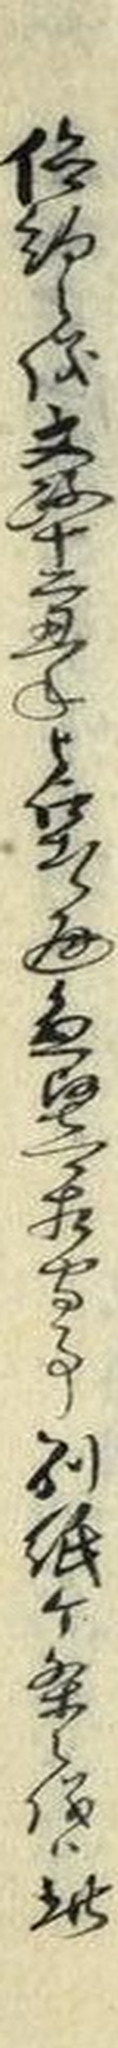倹約之儀文政十二丑年被仰出候通愈堅可相守事別紙ケ条之儀ハ此

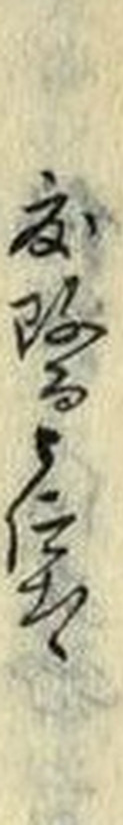度改而被仰出候
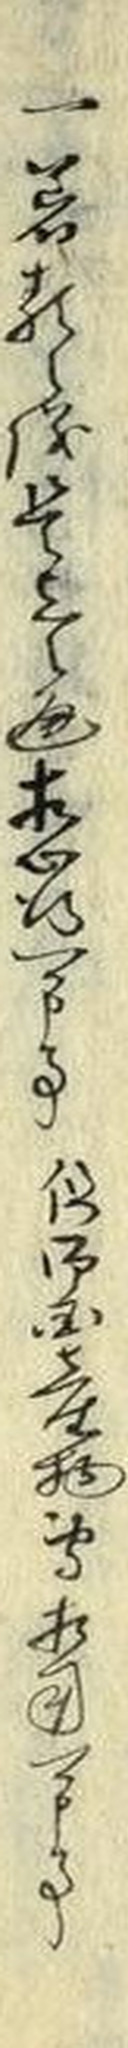一着類之儀是迄之通相心得可申事但御国産物専相用可申事
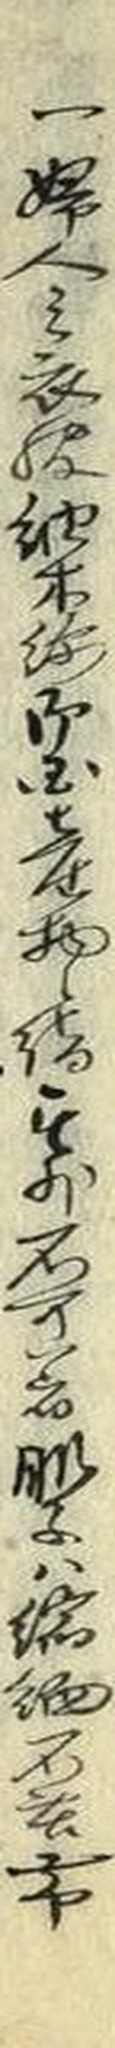一婦人之衣服紬木綿御国産物之縞其外不可着肌子ハ縮緬不苦帯
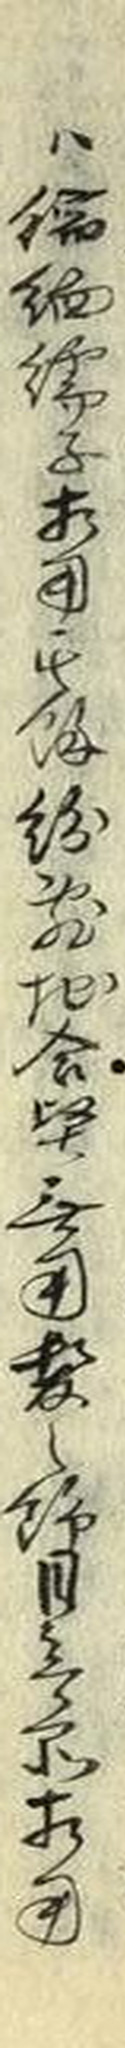ハ縮緬繻子相用其余紛敷地合堅無用髪之飾目立候品相用
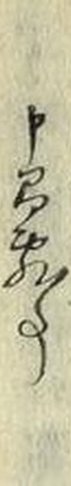申間敷事
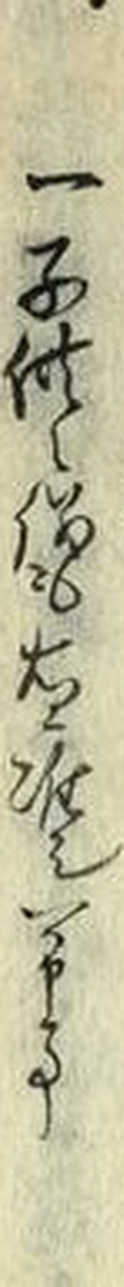一子供之儀も右ニ准シ可申事
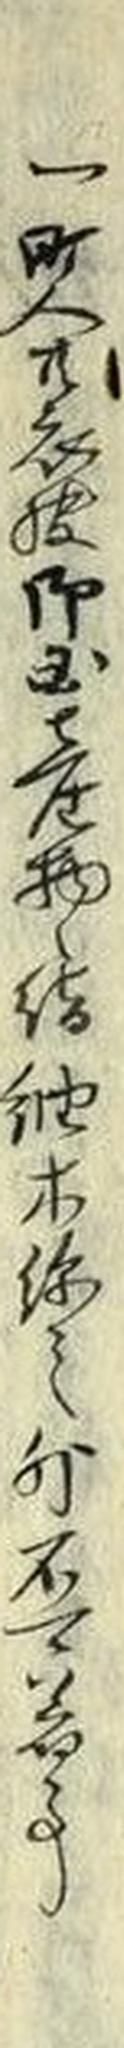一町人共衣服御国産物之縞紬木綿之外不可着事
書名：少傅日録抄（斉善付側向頭取日記、在府）
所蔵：福井県文書館 Fukui Prefectural Archives
